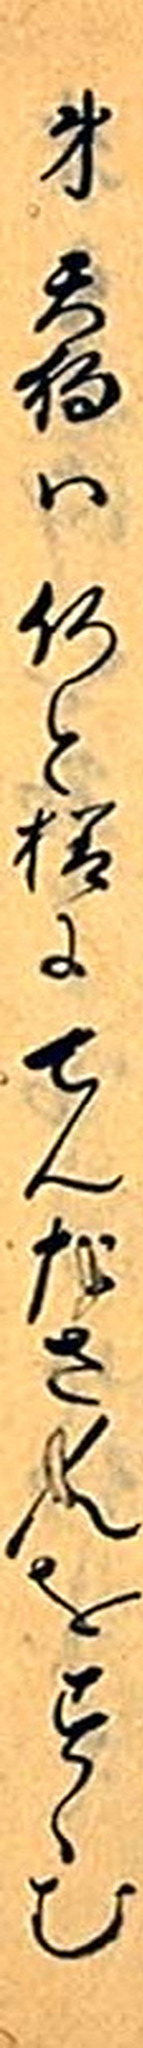弟天狗は何と様にてんたさんをすゝむ
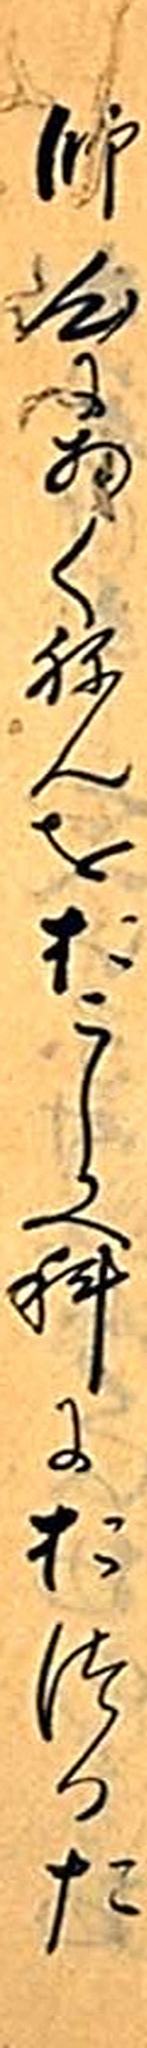師心にあくねんをおこし又科におつるた
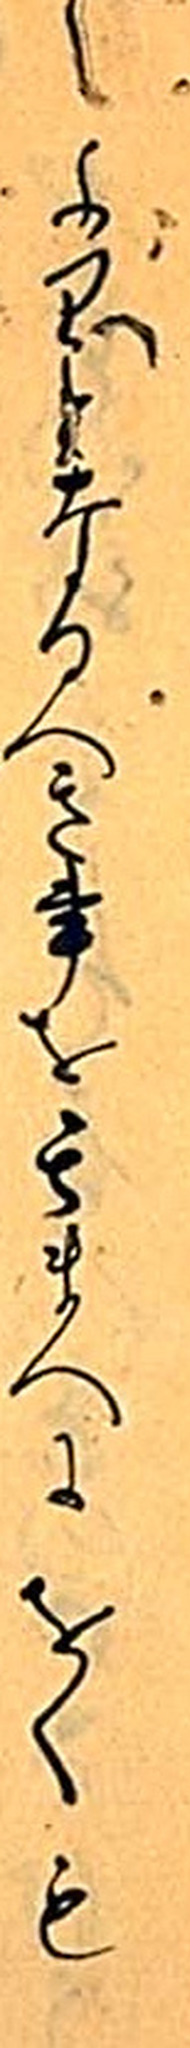よりとなるへき事を其まえにをくも
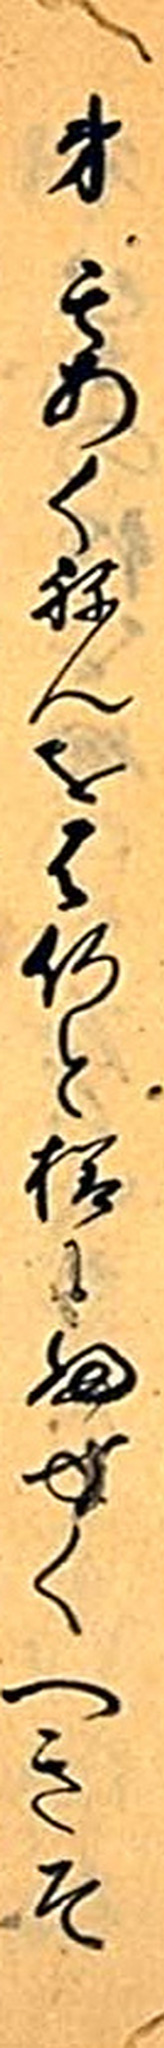弟其あくねんをは何と様にふせくへきそ
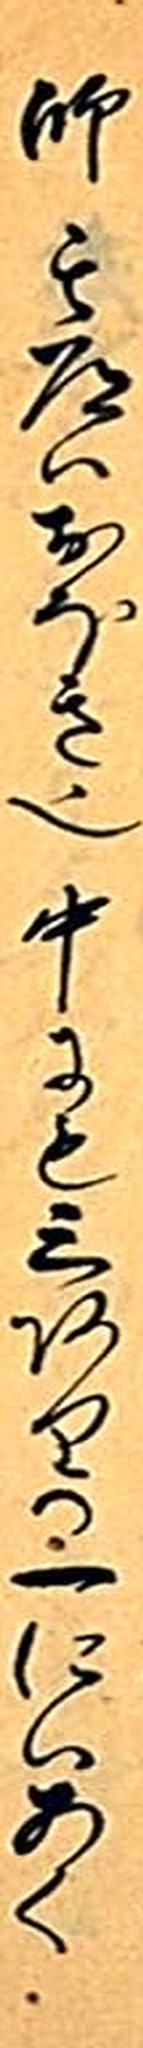師其道はおほき也中にも三あり○一にはあく
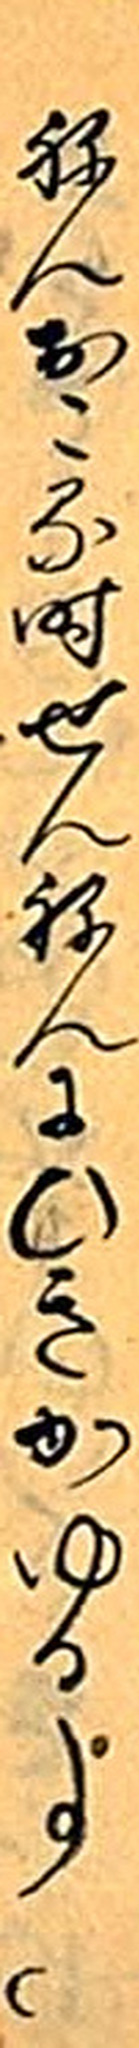ねんおこる時せんねんにひきかゆる事○
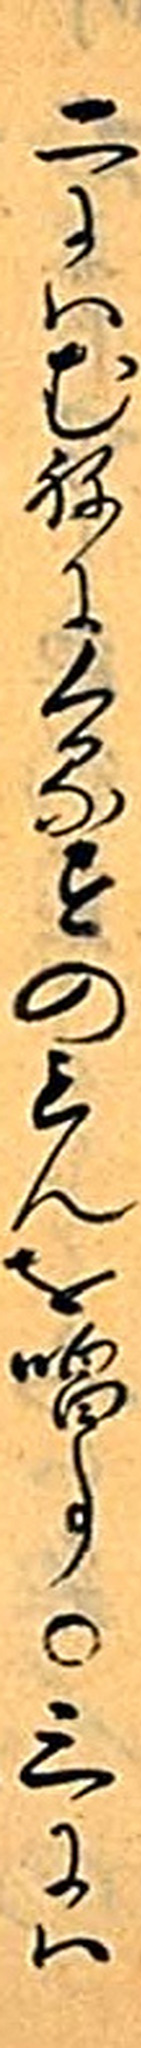二にはむねにくるすのもんを唱事○三には
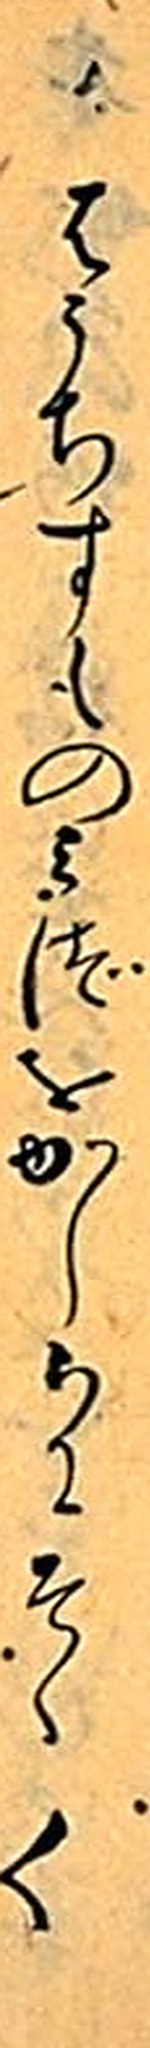はうちすものみづをかしらにそゝく
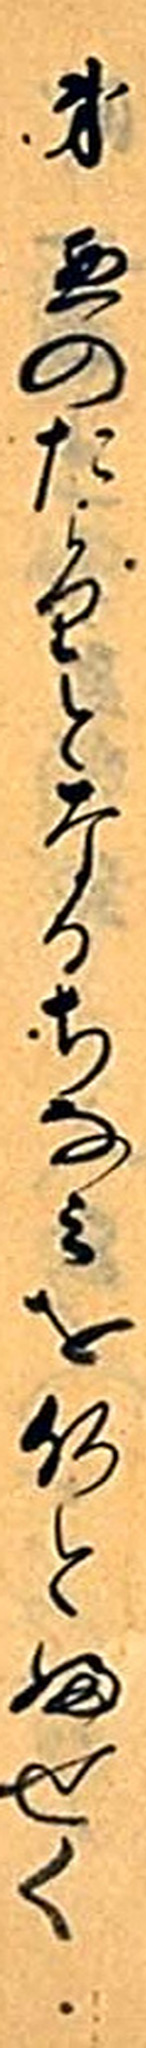弟悪のたよりとなるちなみを何とふせく
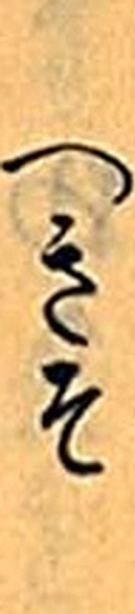へきそ
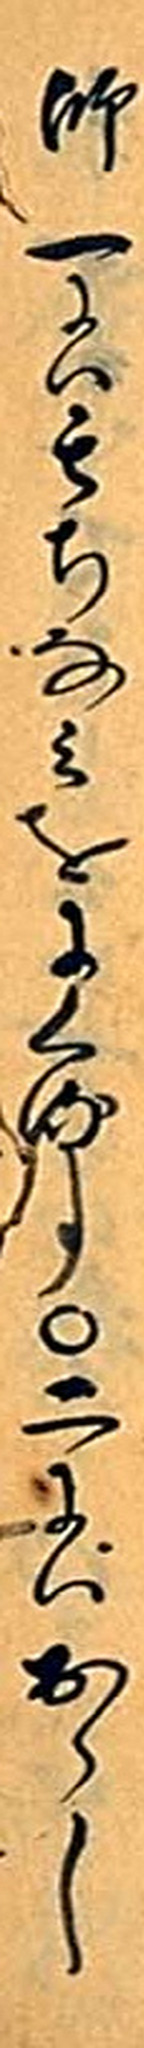師一には其ちなみをにくる事○二にはおらし

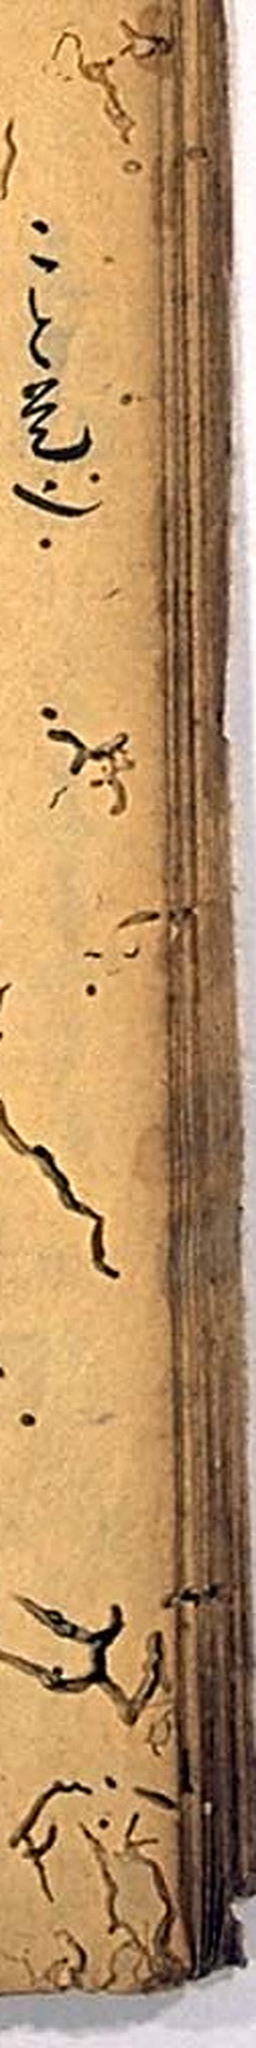こと是也
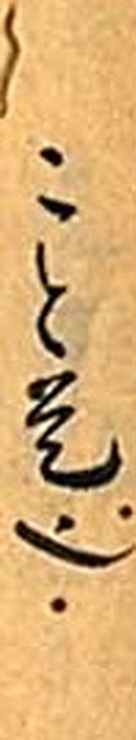こと是也
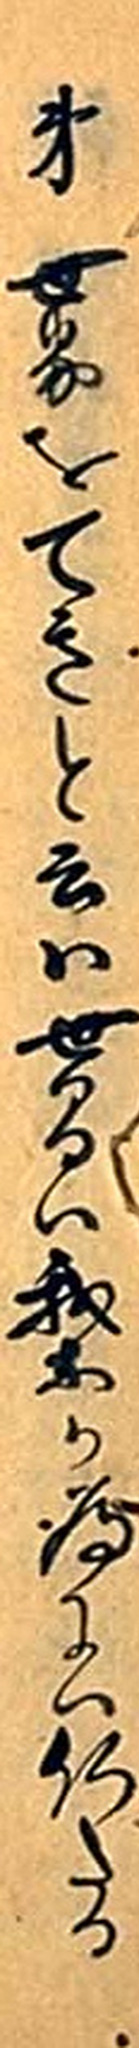弟世界をてきと云は世間は我等か為には何たる
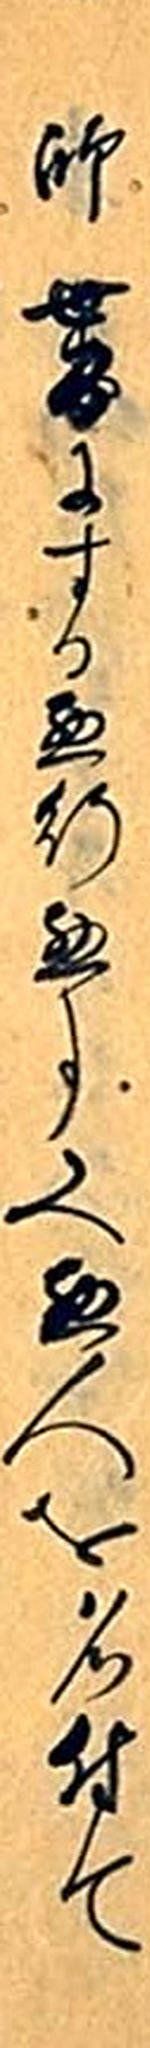師世間にする悪行悪事又悪人を名付て
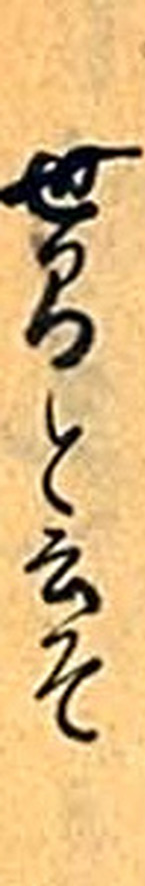世間と云そ
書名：ドチリナ・キリシタン
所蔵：東京大学総合図書館 / General Library in the University of Tokyo
